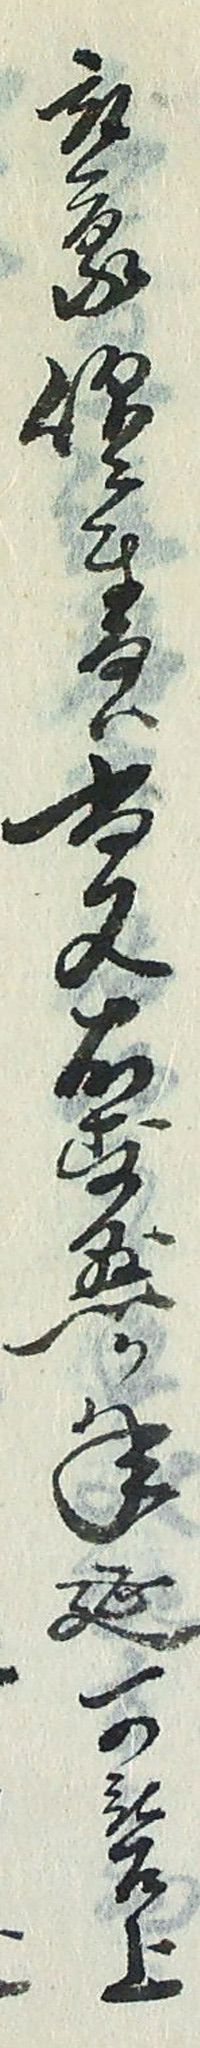被蒙仰ニ付而ハ尚又右歩懸り年延可被召上
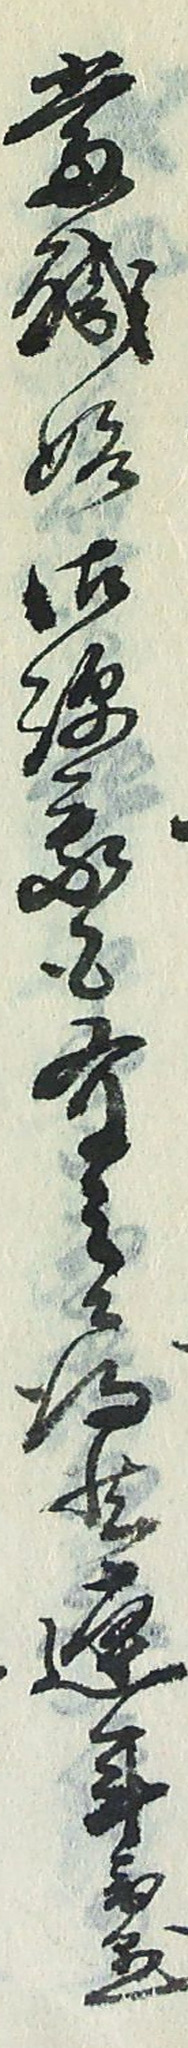當職始御評義も有之候得共連年歩懸
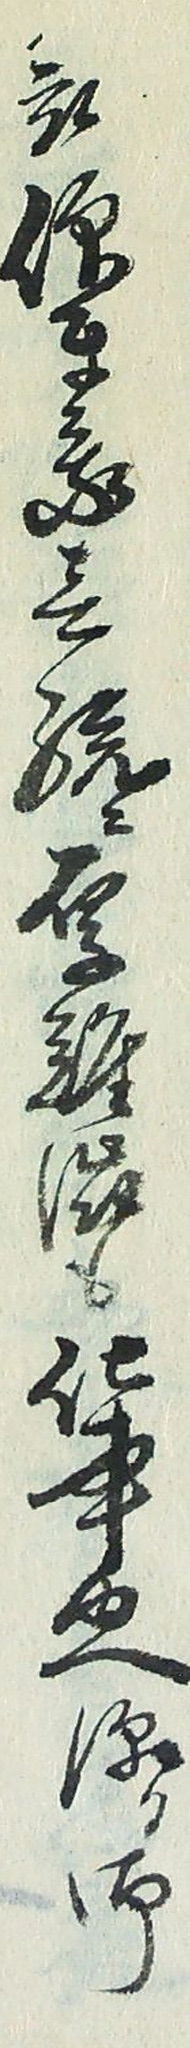被仰付義壱統ニ厚難渋も仕事ゆへ深ク御
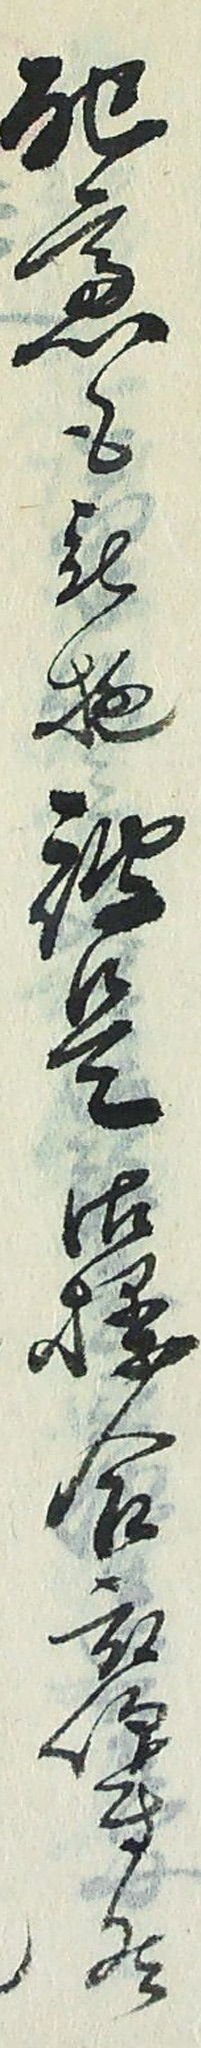配慮も被遊彼是御操合被仰付居候
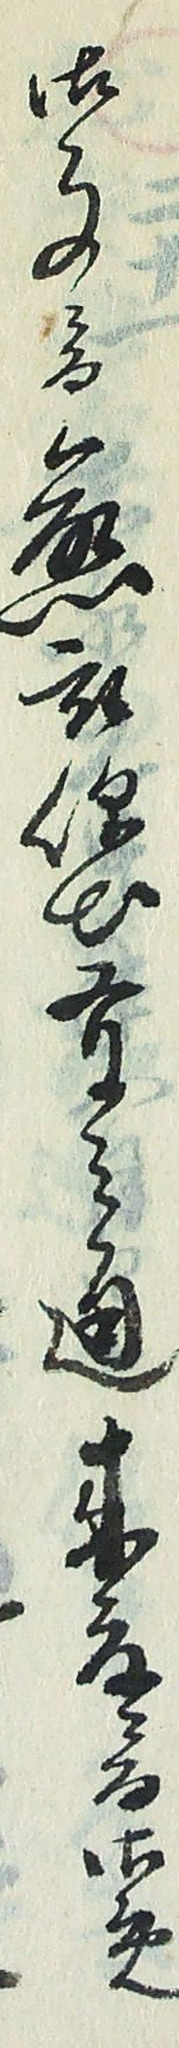御事ニ而愈被仰出有之通来夏ニ而御免
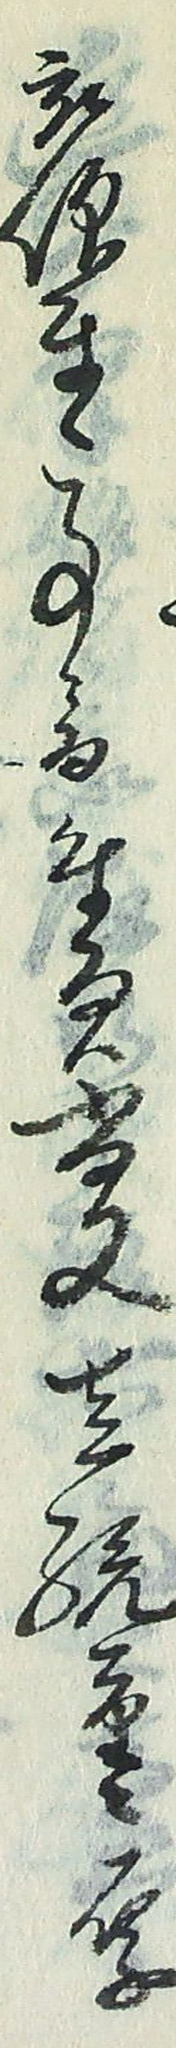被仰付候事ニ而付而ハ尚又壱統重々厚
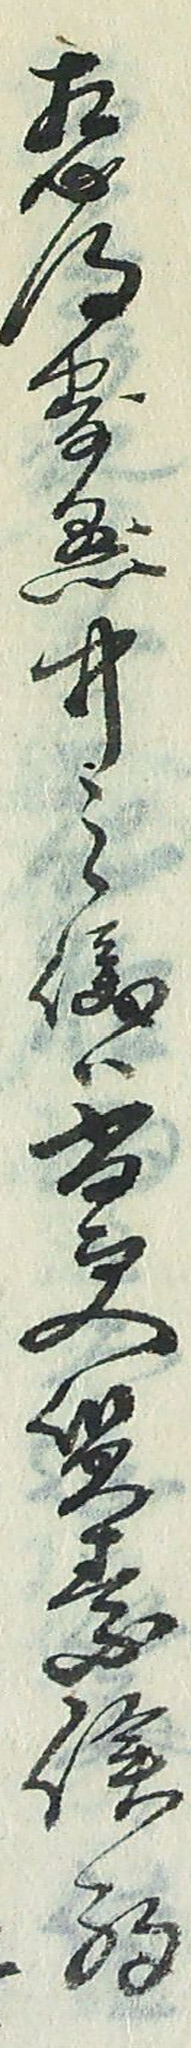相心得歩懸中之儀ハ尚更質素倹約
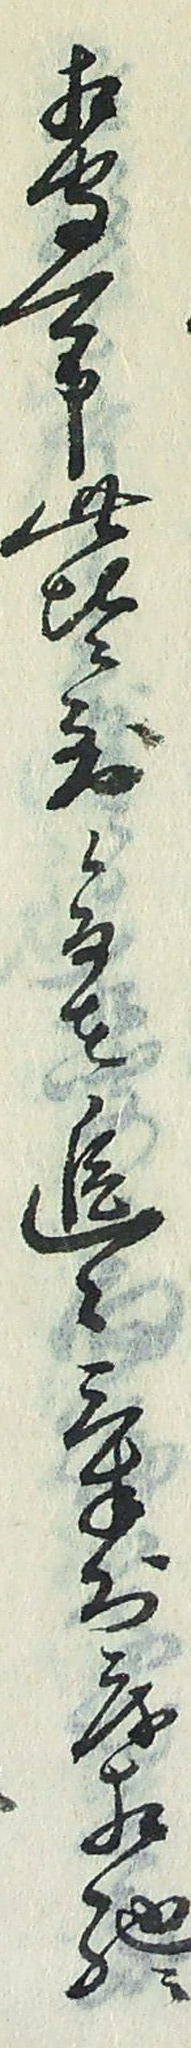相守可申此頃ニ到候而ハ追々氣分茂相弛ミ
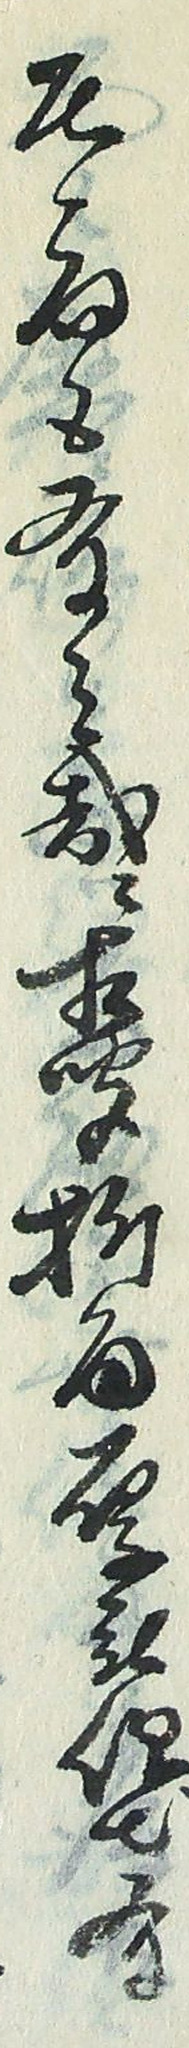居候向も有之哉ニ相聞折角厚被仰出有
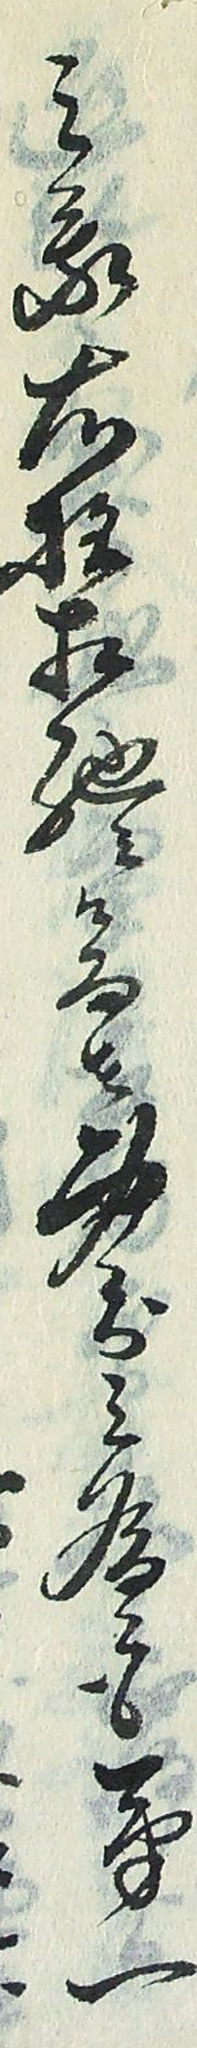之義右様相弛ミ候而者身分之為ニも第一
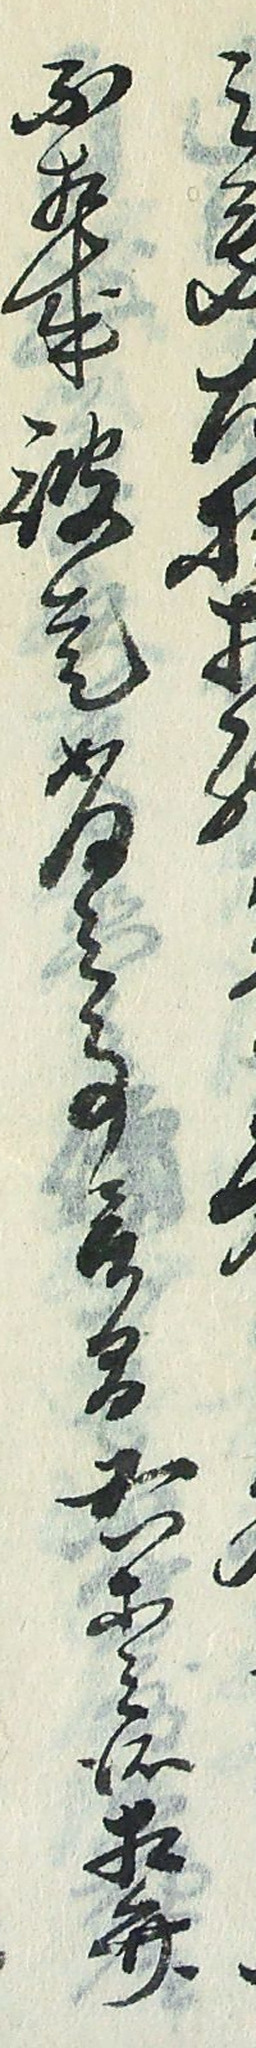不相成彼是如何之事ニ候間右等之所相弁
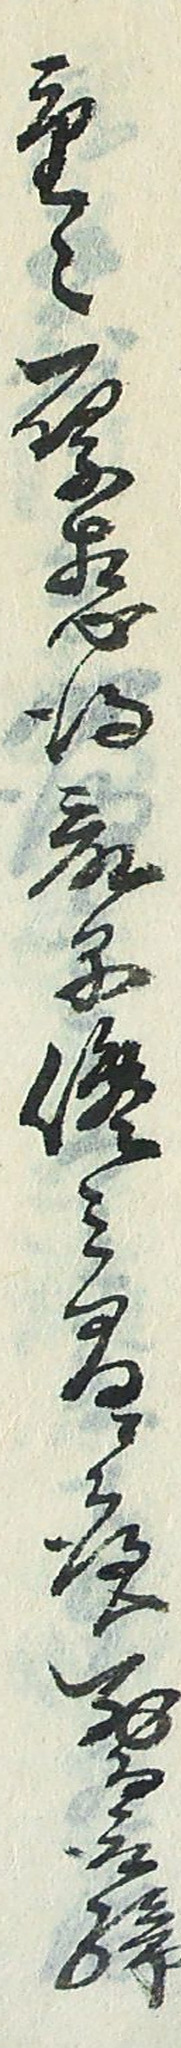重々厚相心得最早纔之間ニ候得ハ別而取締

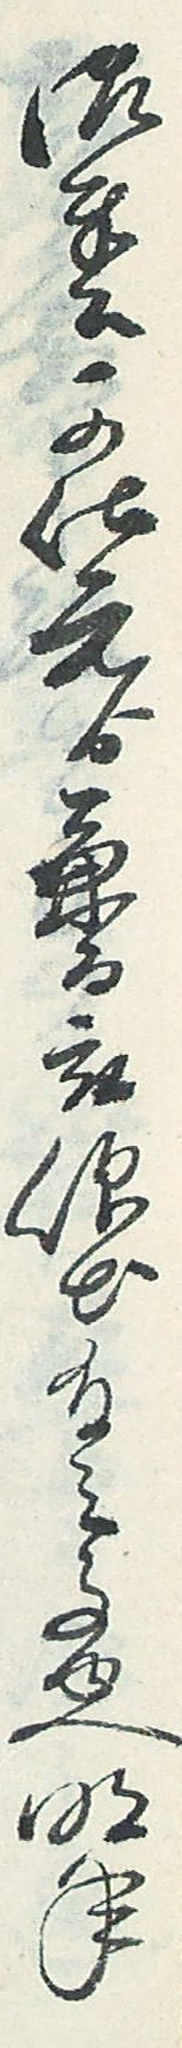御奉公可仕元ゟ兼而被仰出有之事ゆへ明年
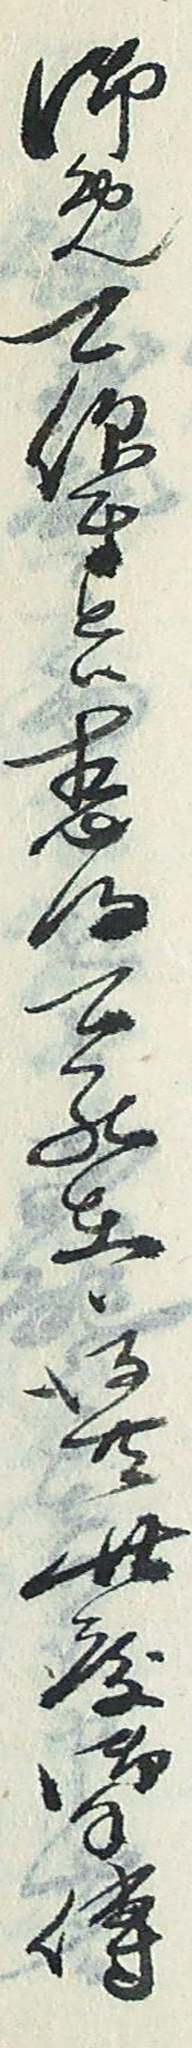御免可仰付とハ相心得可罷在候得共此度御手傳
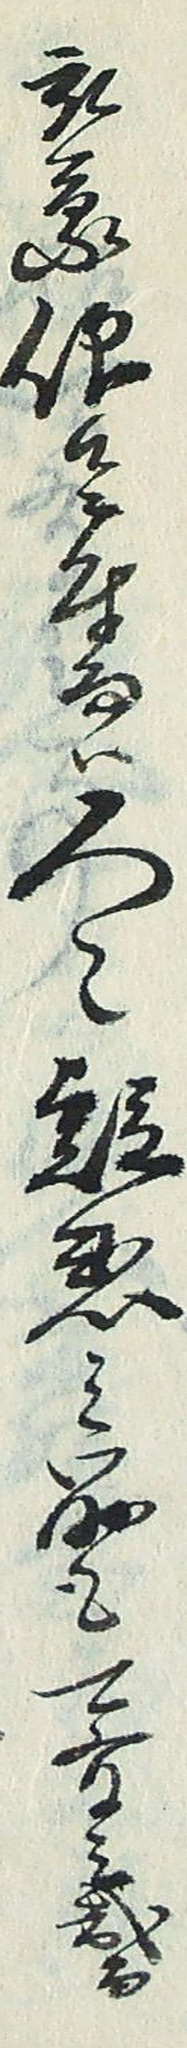被蒙仰候ニ付而ハ人々疑惑之筋も可有之哉と
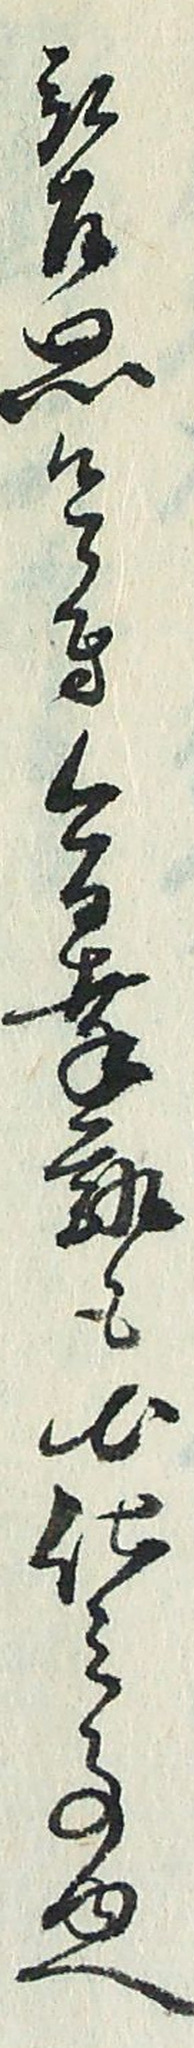被召思候ニ付今日幸執も出仕之事ゆへ
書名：諸御趣意書并御下知向之写
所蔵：鳴門教育大学 Naruto University of Education
